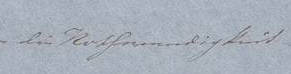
die Nothwendigkeit eines
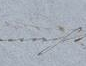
gemacht,
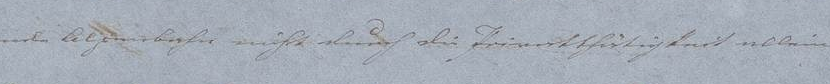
erstellende Alpenbahn nicht durch die Privatthätigkeit allein
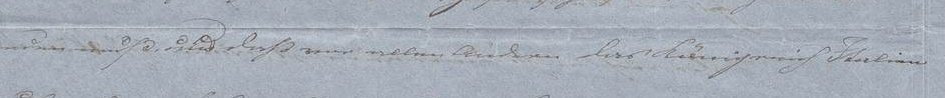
werden muß, und daß vor allen Andern das Königreich Italien
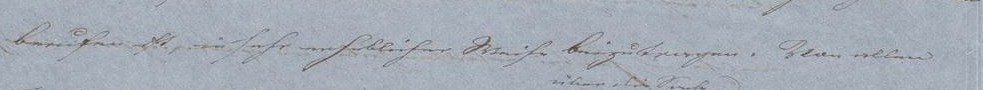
berufen ist, in sehr erheblicher Weise beizutragen. Von allen
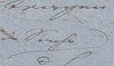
Personen,
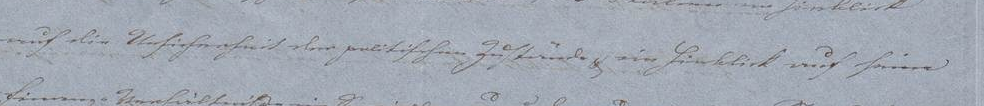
auf die Unsicherheit der politischen Zustände & im Hinblick auf seine
